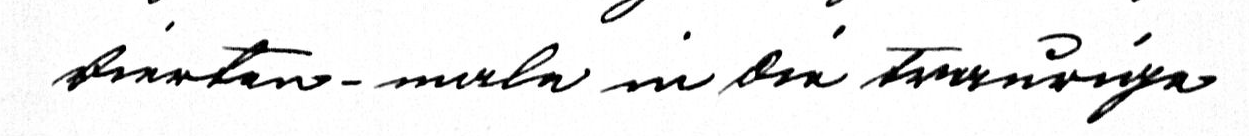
vierten-male in die Traurige
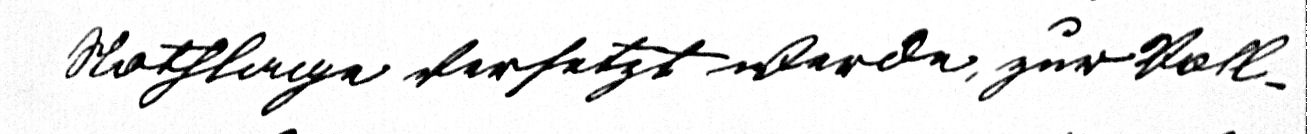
Nothlage versetzt werde, zur Voll¬
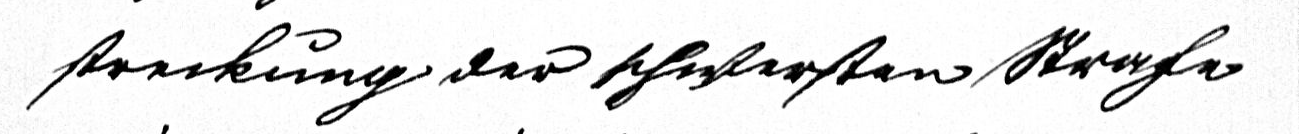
streckung der schwersten Strafe
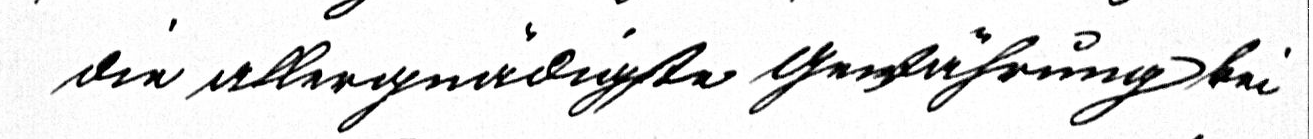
die allergnädigste Gewährung bei
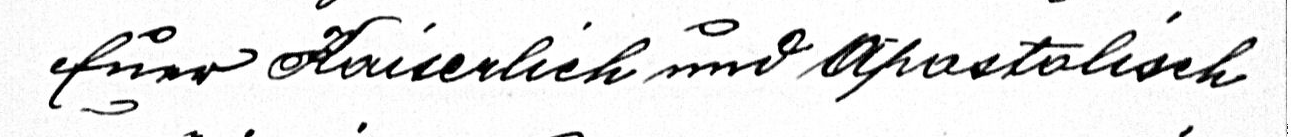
Euer Kaiserlich und Apostolisch
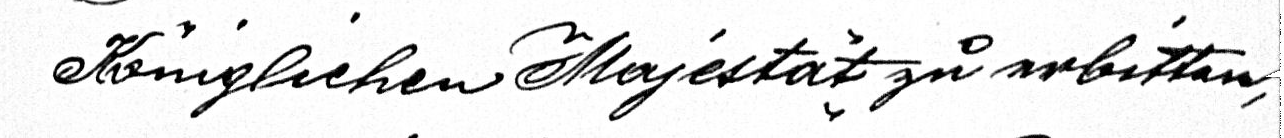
Königlichen Majestät zu erbitten,
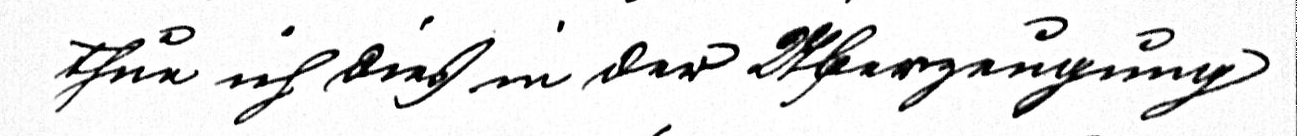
thue ich dies in der Überzeugung
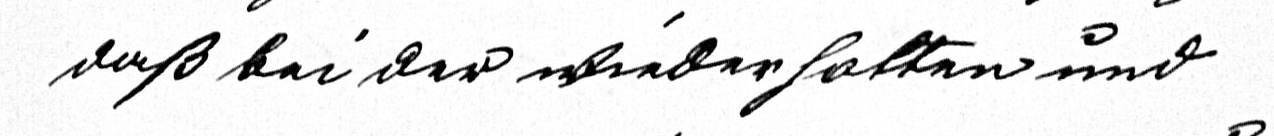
daß bei der wieder holten und
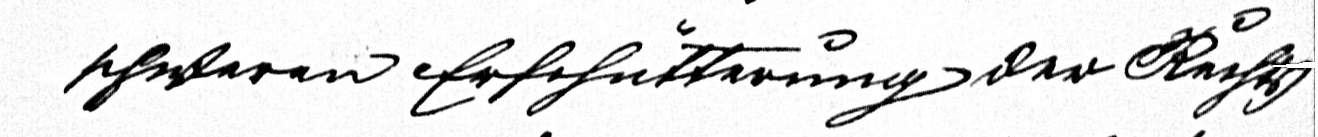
schweren Erschütterung der Rechts¬
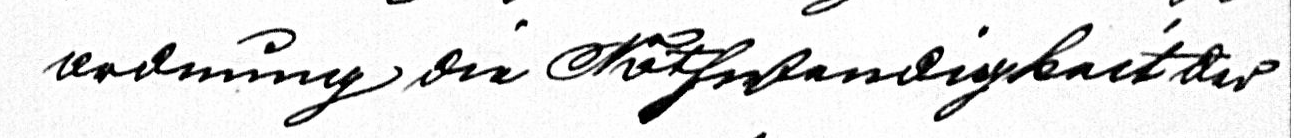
ordnung die Nothwendigkeit der
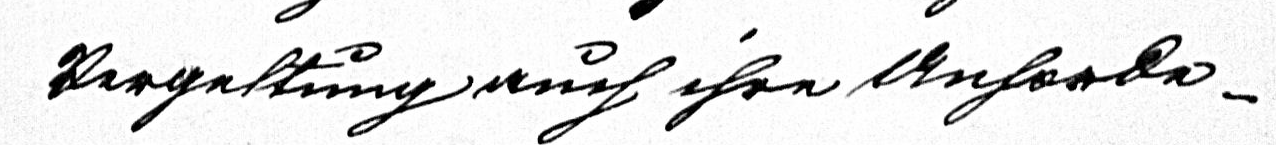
Vergeltung auch ihre Anforde¬
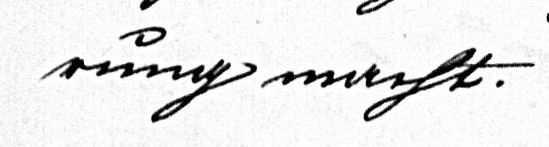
rung macht.
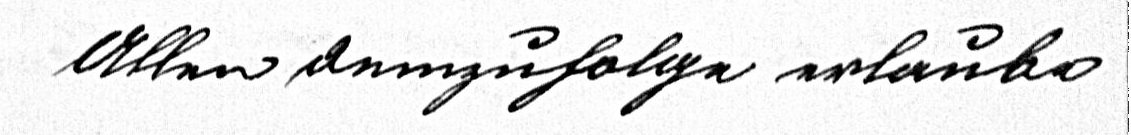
Allen demzufolge erlaube
